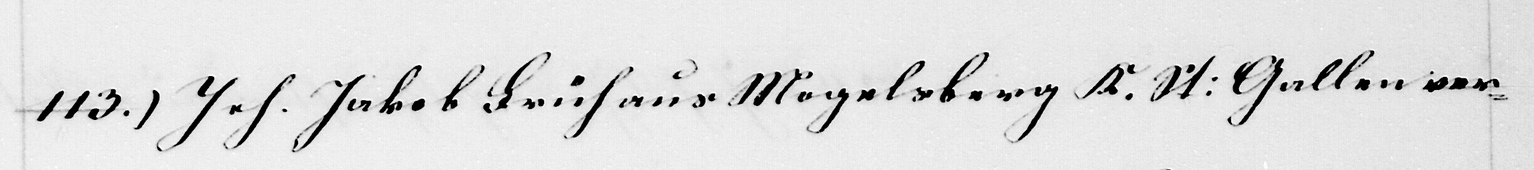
113.) Joh. Jakob Früh aus Mogelsberg K. St: Gallen ver¬
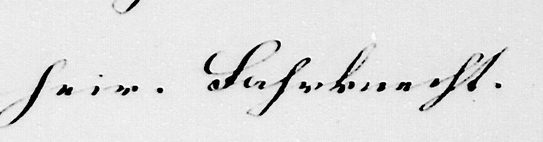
heir. Fahrknecht.
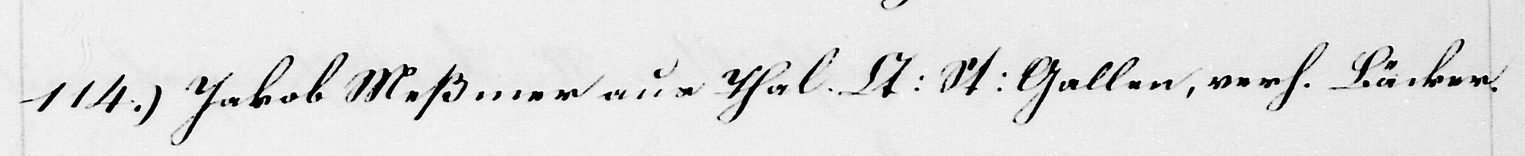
114.) Jakob Meßmer aus Thal Ct: St: Gallen, verh. Bäcker.
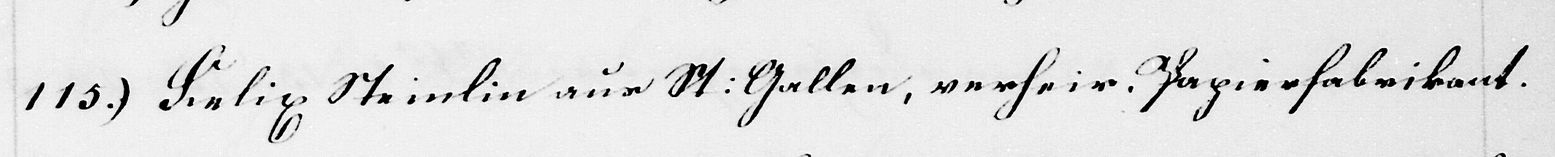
115.) Felix Steinlin aus St: Gallen, verheir. Papierfabrikant.
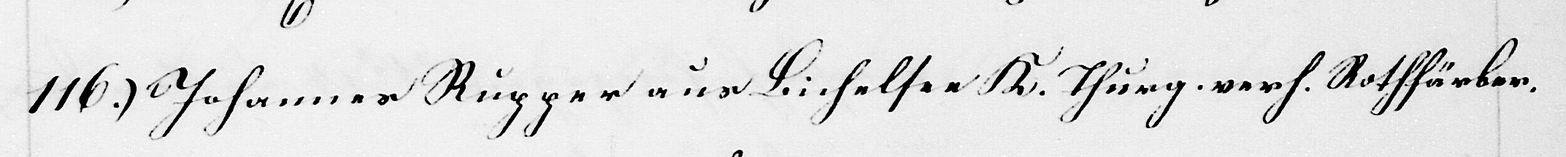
116.) Johannes Rupper aus Bichelsee K. Thurg. verh. Rothfärber.
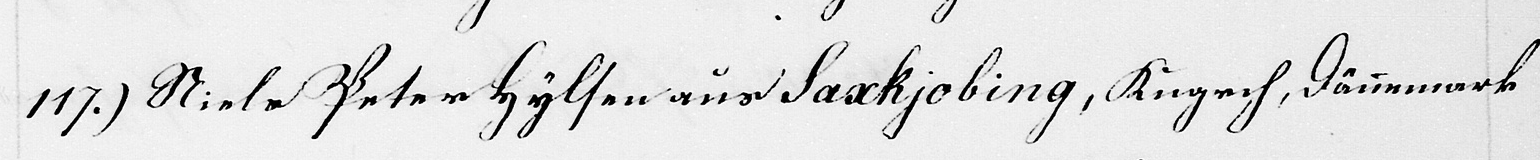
117.) Niels Peter Hylsen aus Saxkjobing, Kngrch, Dännemark
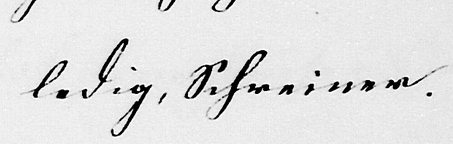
ledig, Schreiner.
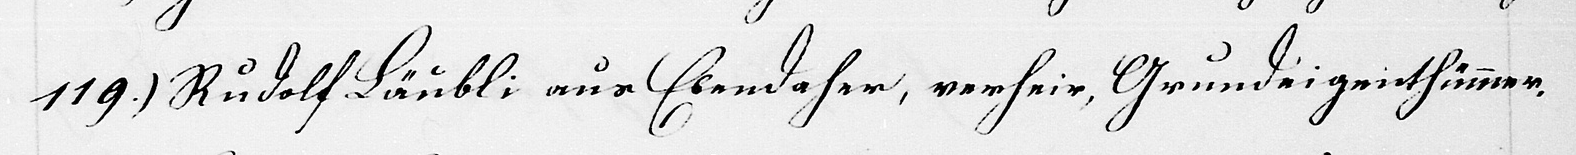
119.) Rudolf Läubli aus Ebendaher, verheir, Grundeigenthümmer.
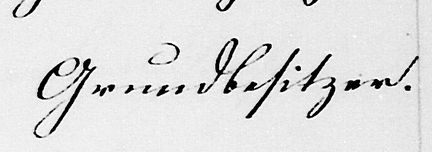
Grundbesitzer.
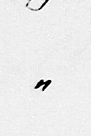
„
